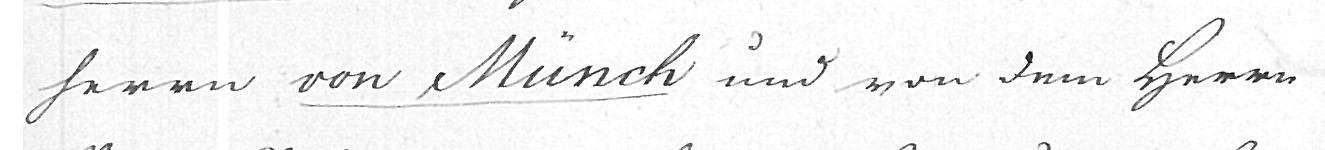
herrn von Münch und von dem Herrn
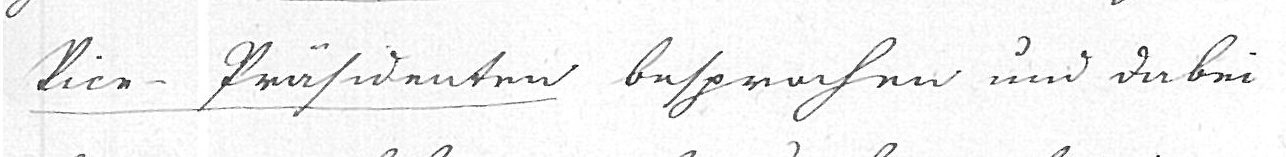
Vice-Präsidenten besprochen und dabei
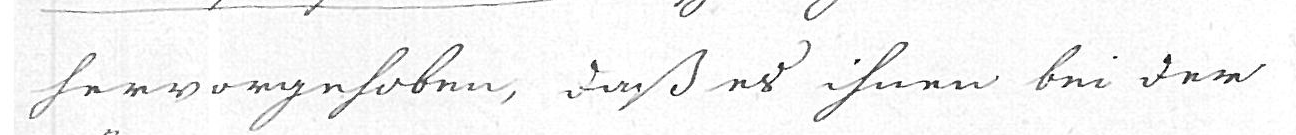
hervorgehoben, daß es ihnen bei der
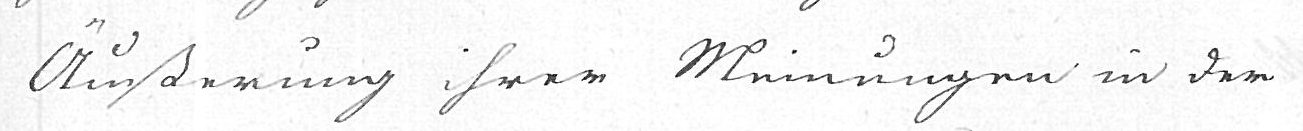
Äußerung ihrer Meinungen in der
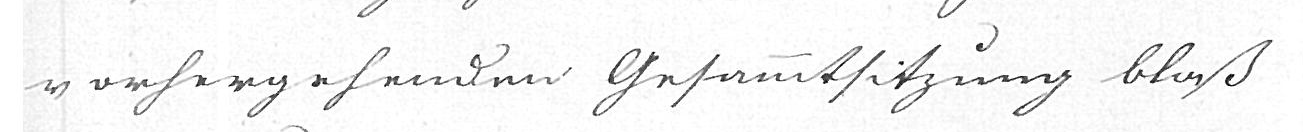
vorhergehenden Gesammtsitzung bloß
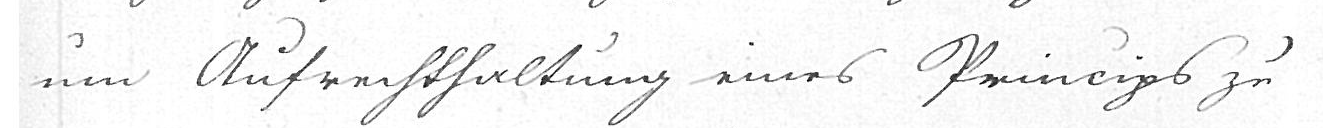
um Aufrechthaltung eines Princips zu
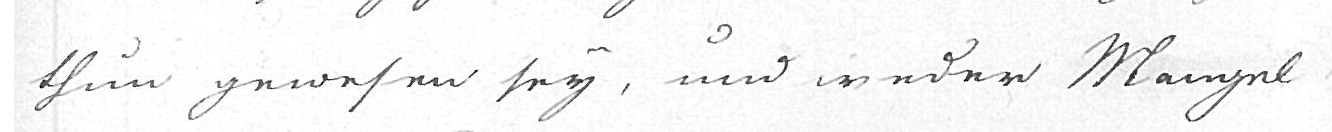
thun gewesen sey, und weder Mangel
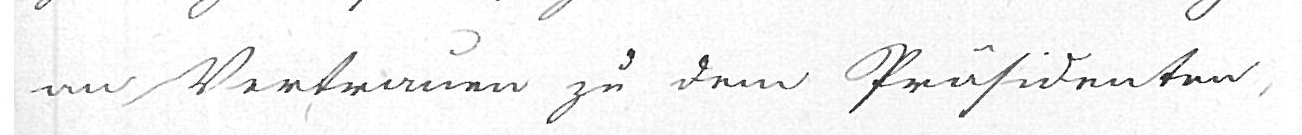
an Vertrauen zu dem Präsidenten,
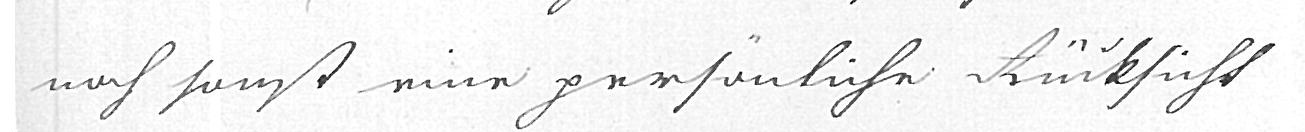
noch sonst eine persönliche Rücksicht
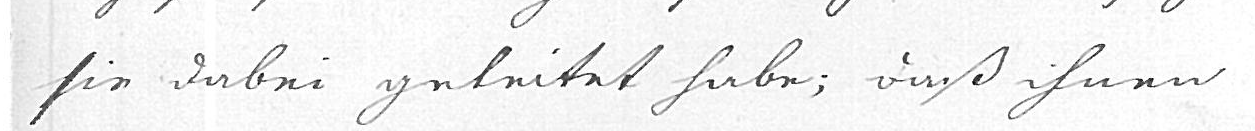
sie dabei geleitet habe; daß ihnen
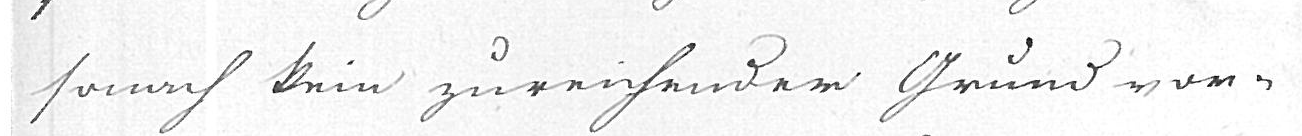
sonach kein zureichender Grund vor-
